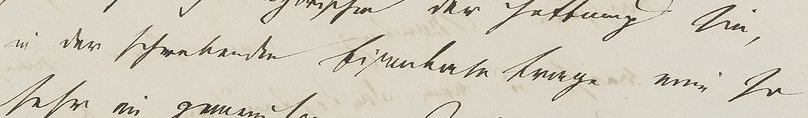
in der schwebenden Eisenbahnfrage eine so
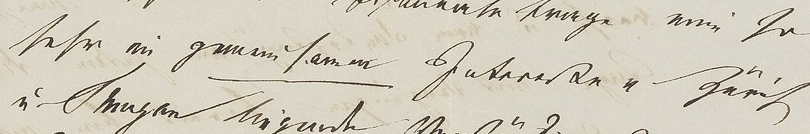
sehr im gemeinsamen Interesse v. Zürich
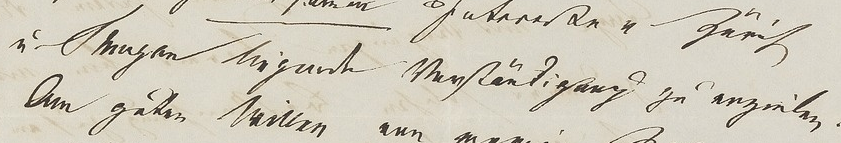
u. Thurgau liegende Verständigung zu erzielen.
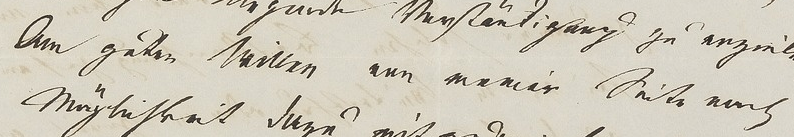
Am guten Willen von meiner Seite nach
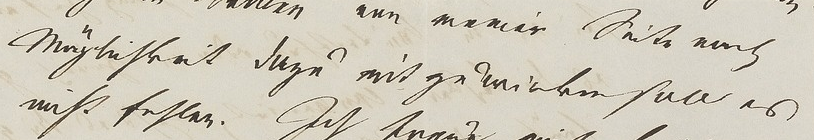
Möglichkeit dazu mit zu wirken soll es
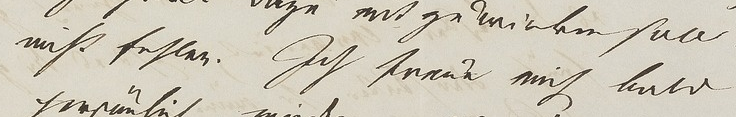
nicht fehlen. Ich freue mich bald
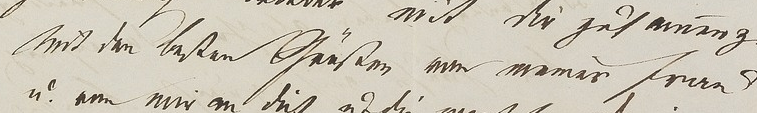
Mit den besten Grüßen von meiner Frau
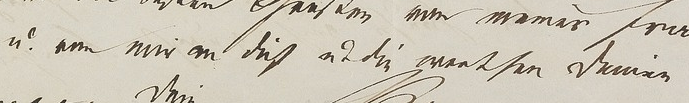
u. von mir an dich u. die werthen Deinen
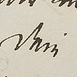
Kern
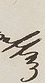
1852.
